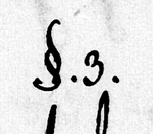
§. 3.
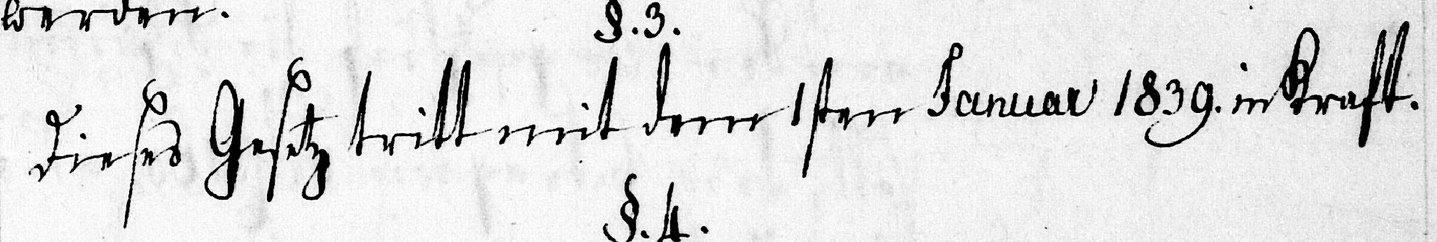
Dieses Gesetz tritt mit dem 1sten Januar 1839. in Kraft.
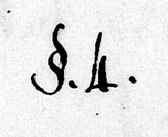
§. 4.
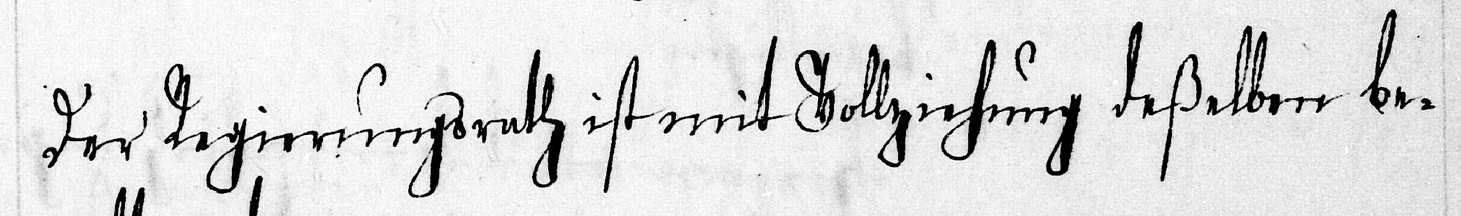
Der Regierungsrath ist mit Vollziehung deßelben be¬
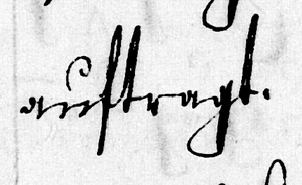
auftragt.
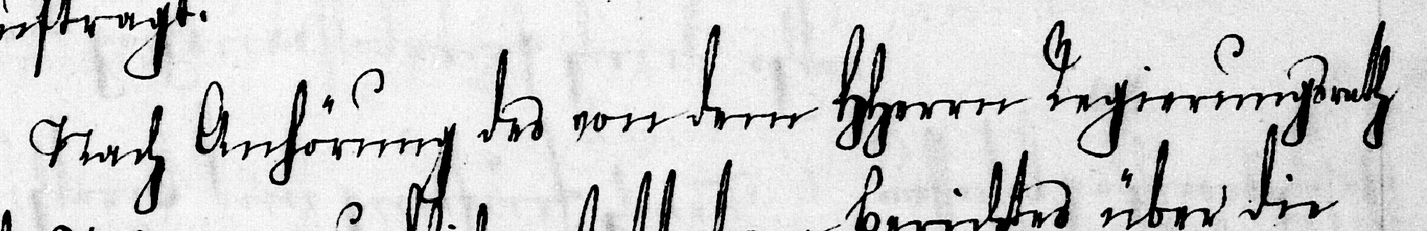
Nach Anhörung des von dem HHerrn Regierungsrath
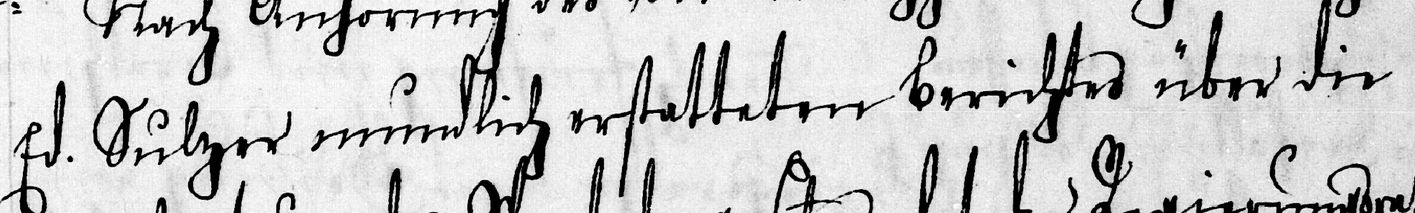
Ed. Sulzer mundlich erstatteten Berichtes über die
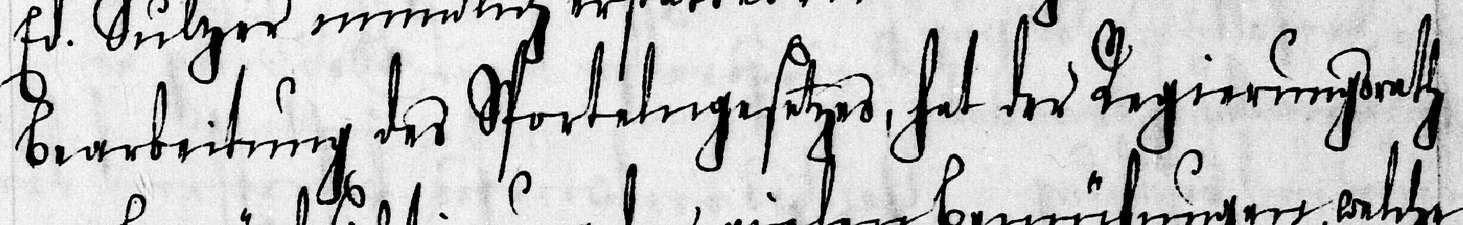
Bearbeitung des Sportelngesetzes, hat der Regierungsrath
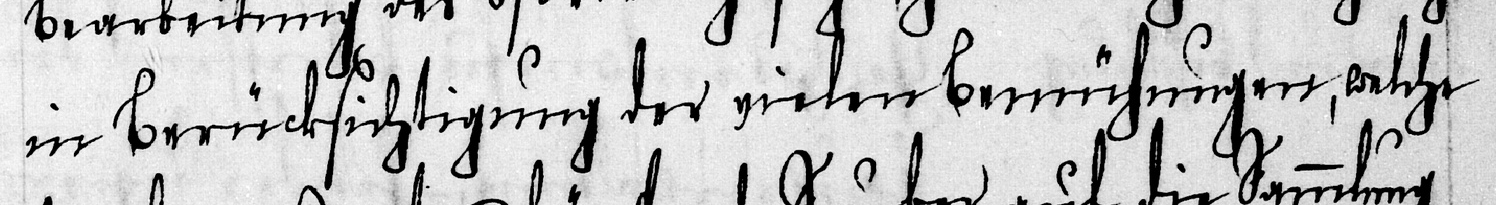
in Berücksichtigung der vielen Bemühungen, welche
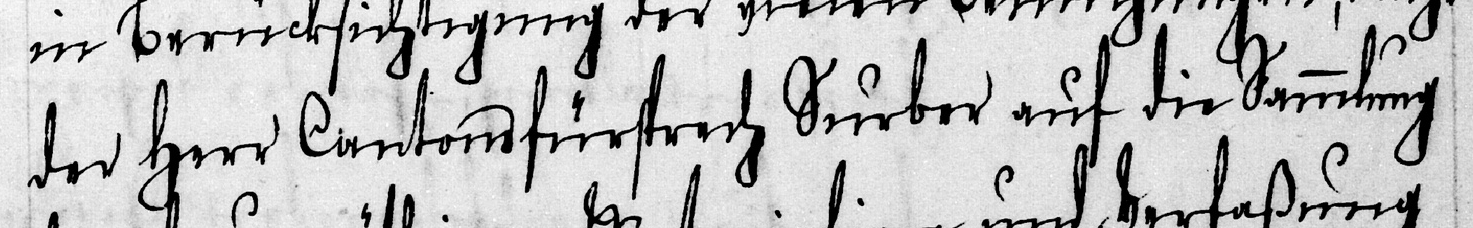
der Herr Cantonsfürsprech Surber auf die Sammlung
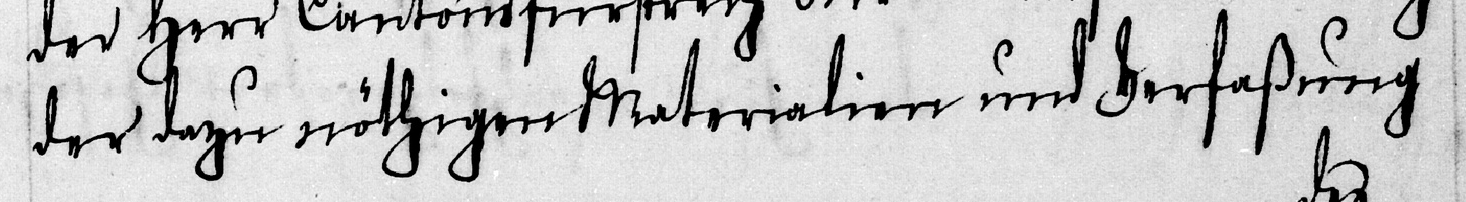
der dazu nöthigen Materialien und Verfaßung
